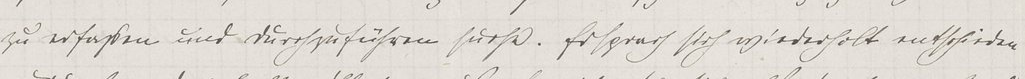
zu erfassen und durchzuführen suche. Er sprach sich wiederholt entschieden
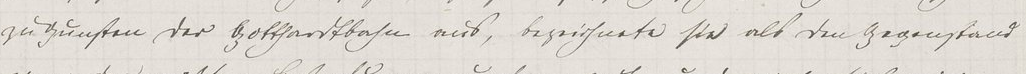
zu Gunsten der Gotthardbahn aus, bezeichnete sie als den Gegenstand
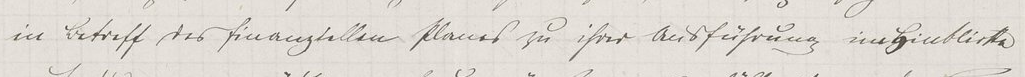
in Betreff des finanziellen Planes zu ihrer Ausführung im Hinblicke
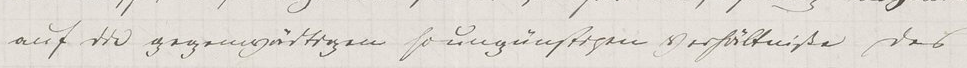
auf die gegenwärtigen so ungünstigen Verhältniße des
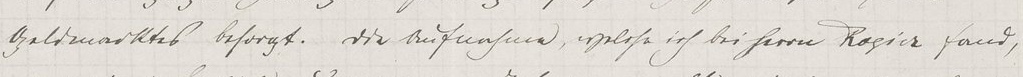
Geldmarktes besorgt. Die Aufnahme, welche ich bei Herrn Rogier fand,
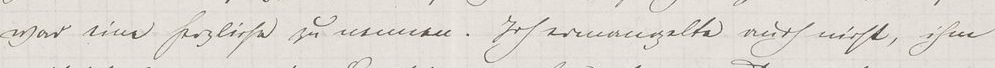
war eine herzliche zu nennen. Ich ermangelte auch nicht, ihm
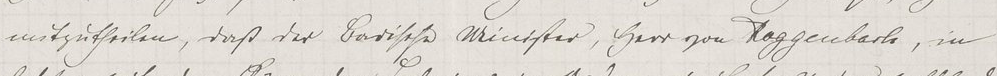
mitzutheilen, daß der Badische Minister, Herr von Roggenbach, in
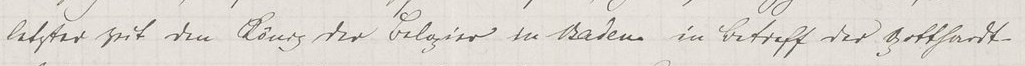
letzter Zeit den König der Belgier in Baden in Betreff der Gotthardt -
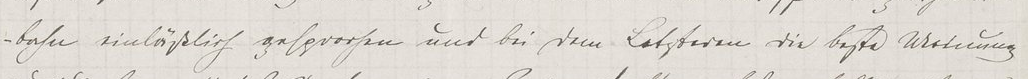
bahn einläßlich gesprochen und bei dem Letzeren die beste Meinung
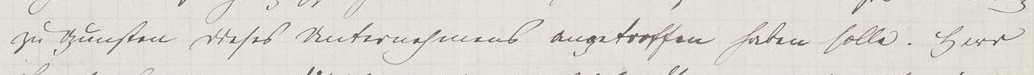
zu Gunsten dieses Unternehmens angetroffen haben solle. Herr
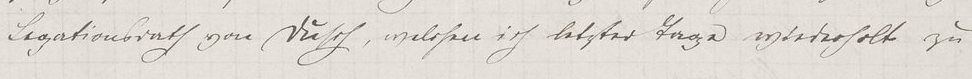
Legationsrath von Dusch, welchen ich letzter Tage wiederholt zu
